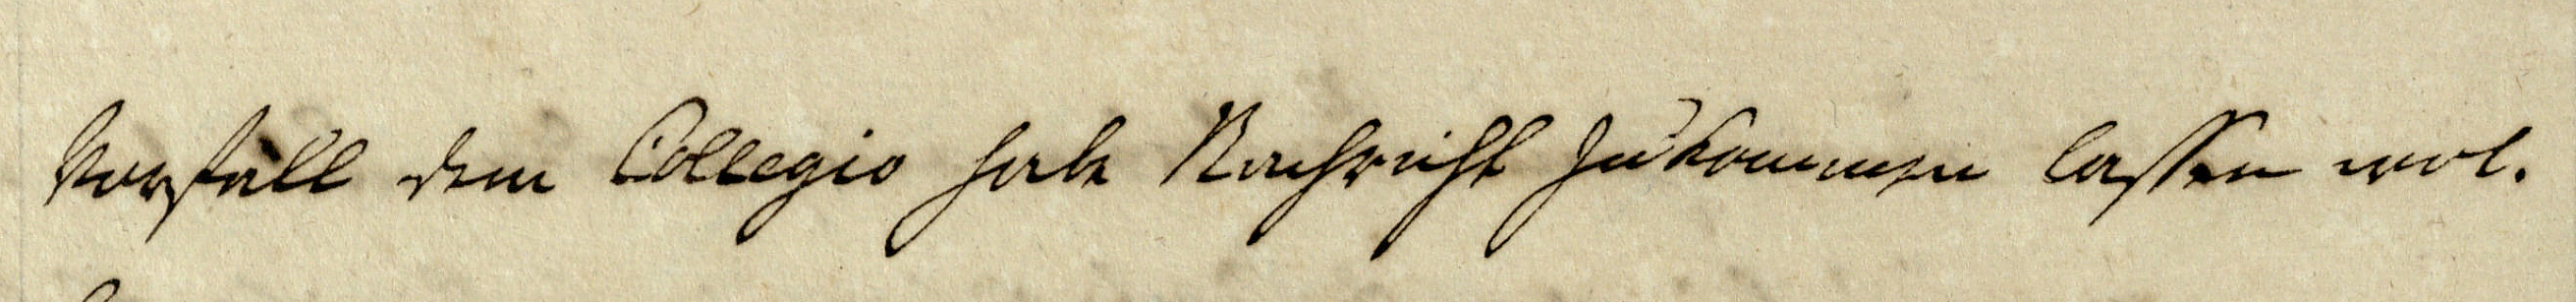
Vorfall dem Collegio habe Nachricht zukommen lassen wol¬
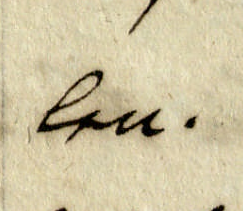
len.
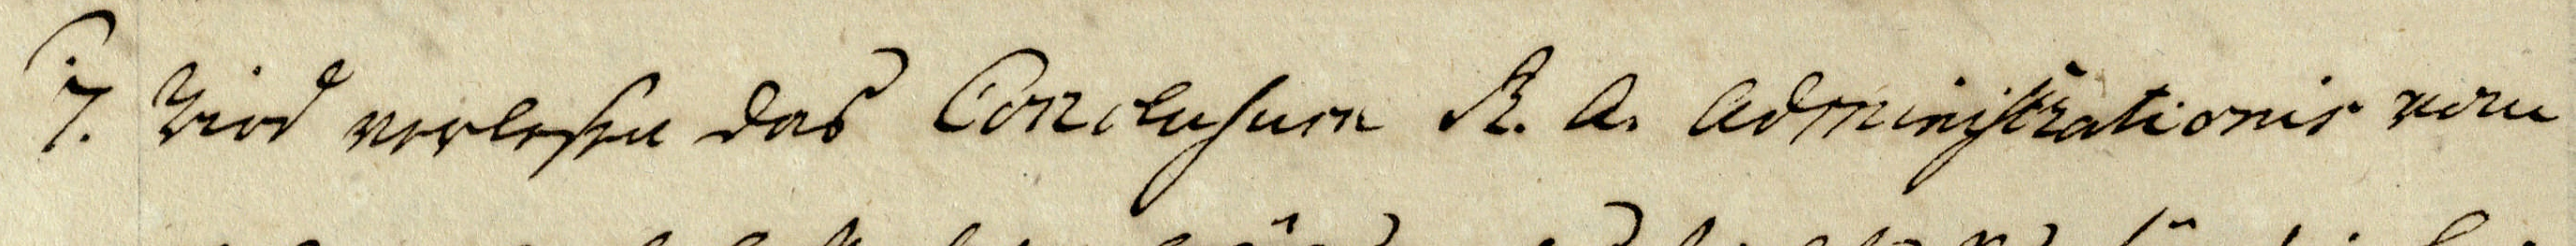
7. Wird verlesen das Conclusum K. A. Administrationis vom
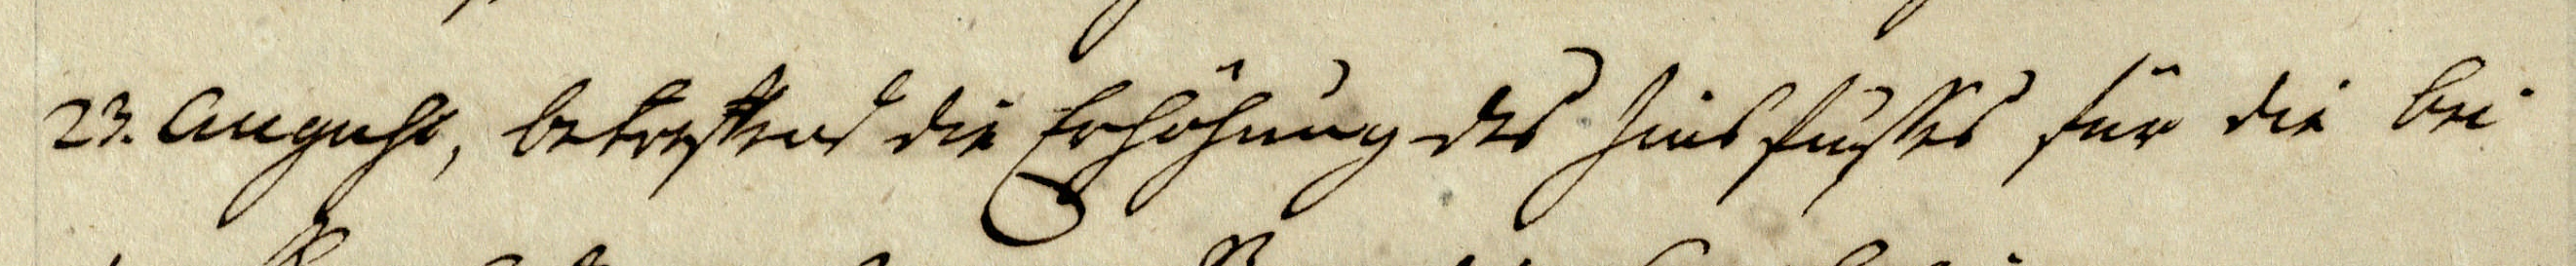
23. August, betreffend die Erhöhung des Zinsfusses für die bei
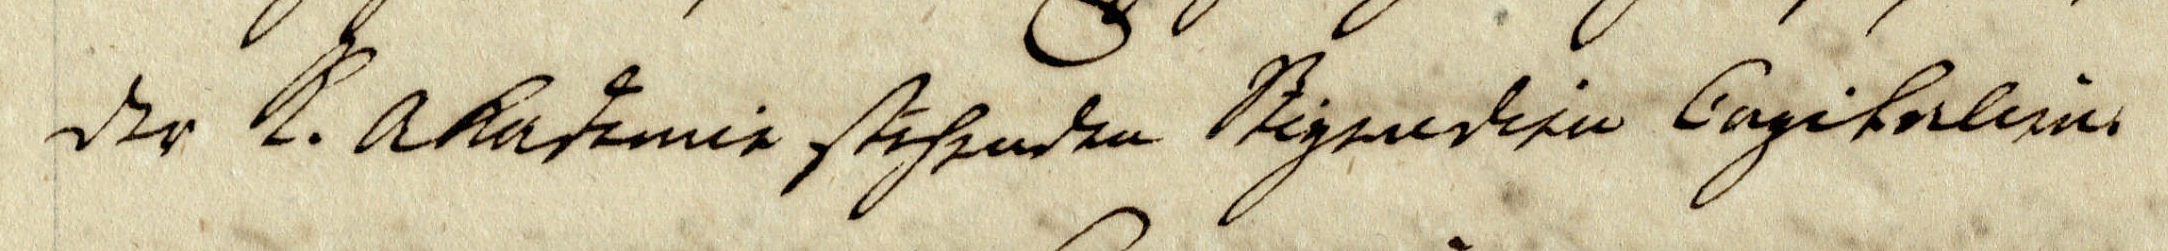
der K. Akademie stehenden Stipendien Capitalien.
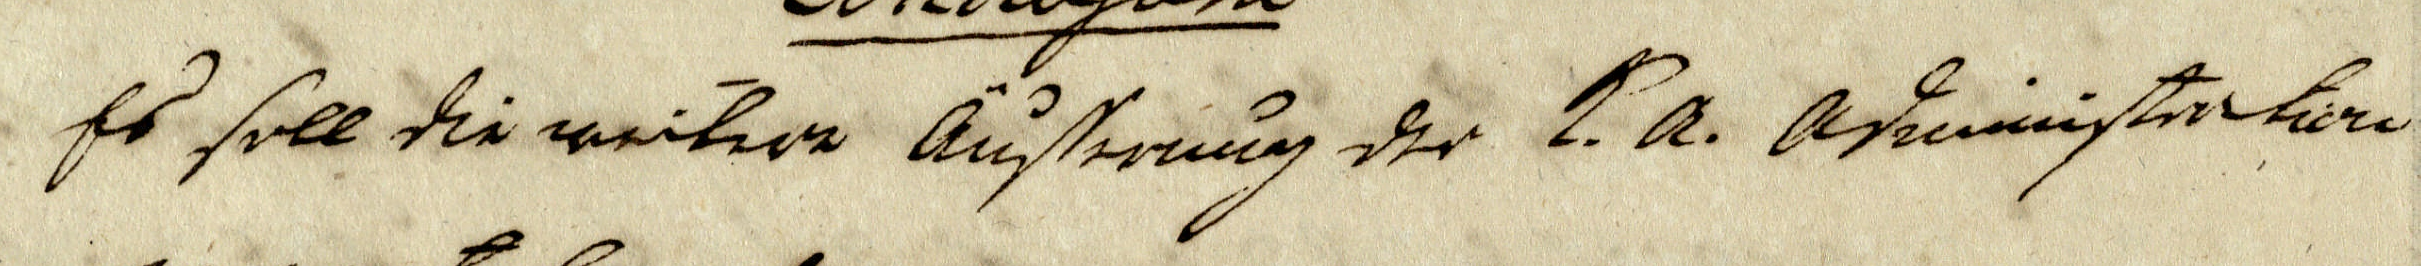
Es soll die weitere Äusserung der K. A. Administration
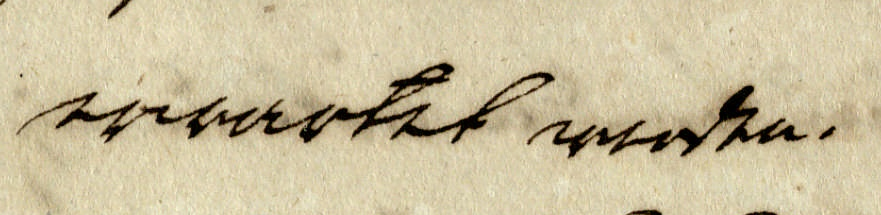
erwartet werden.
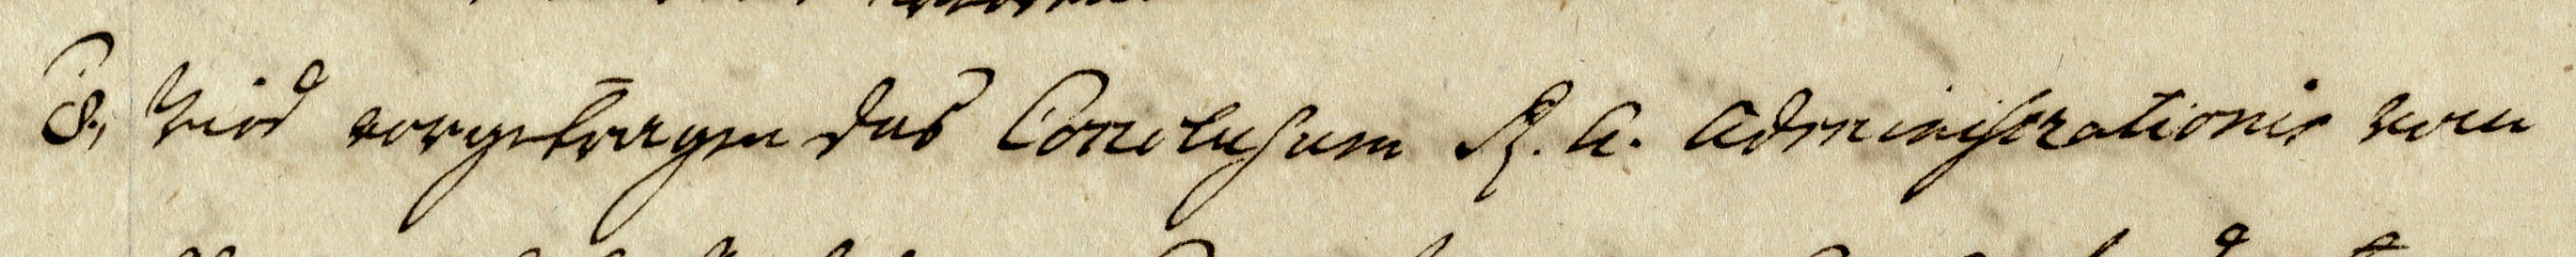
8., Wird vorgetragen das Conclusum K. A. Administrationis vom
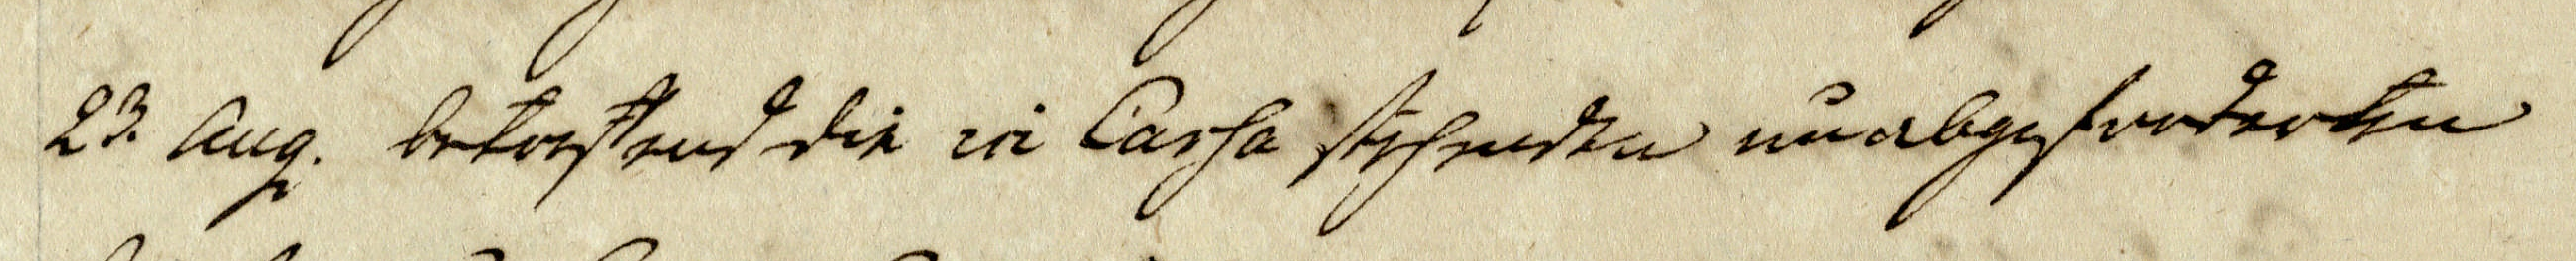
23. Aug. betreffend die in Cassa stehenden unabgeforderten
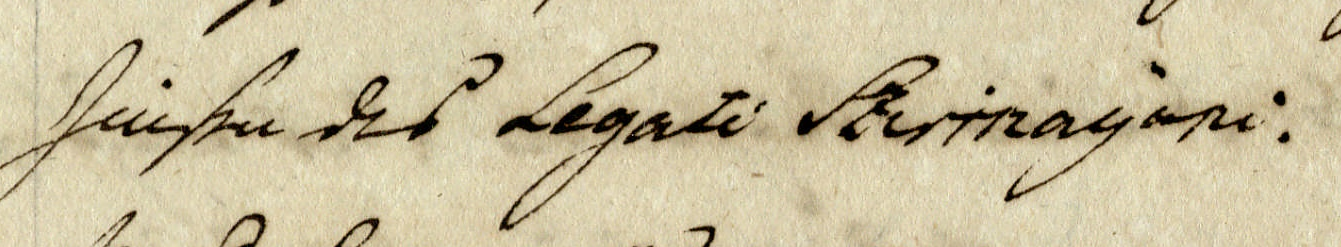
Zinsen des Legati Szirmaÿani.
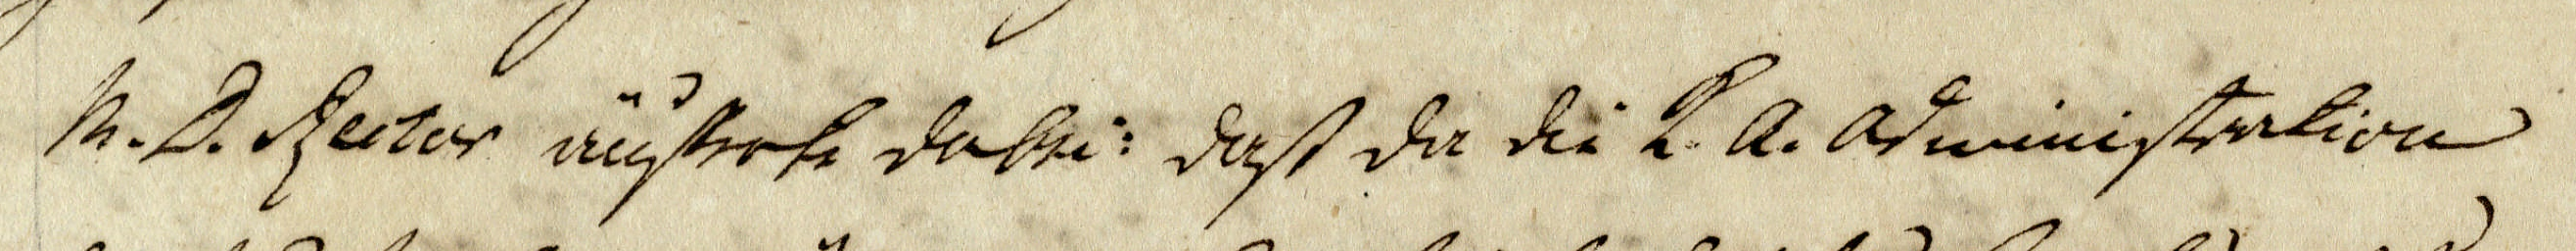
M. D. Rector äusserte dabei: daß da die K. A. Administration
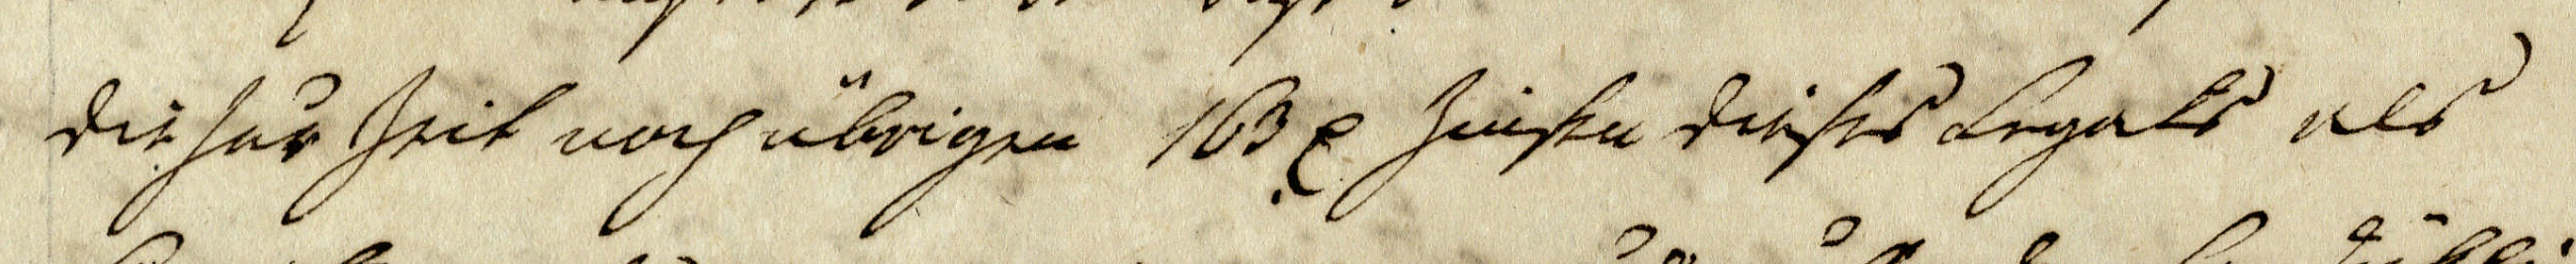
die zur Zeit noch übrigen 163 l. Zinsen dieses Legats als
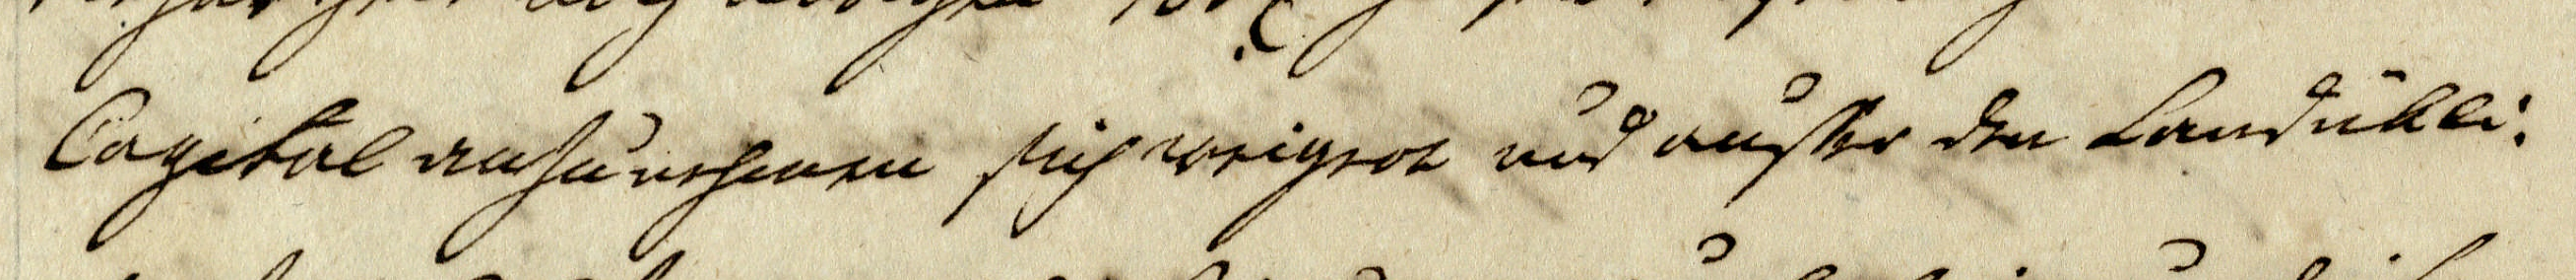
Capital anzunehmen sich weigere und ausser den Landübli¬
